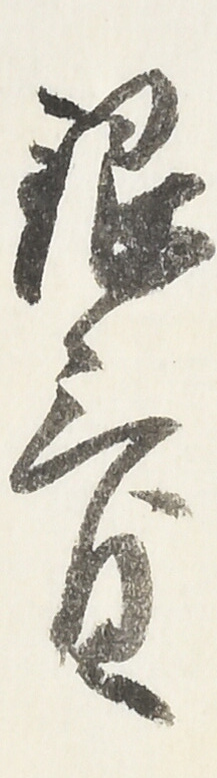銀三匁
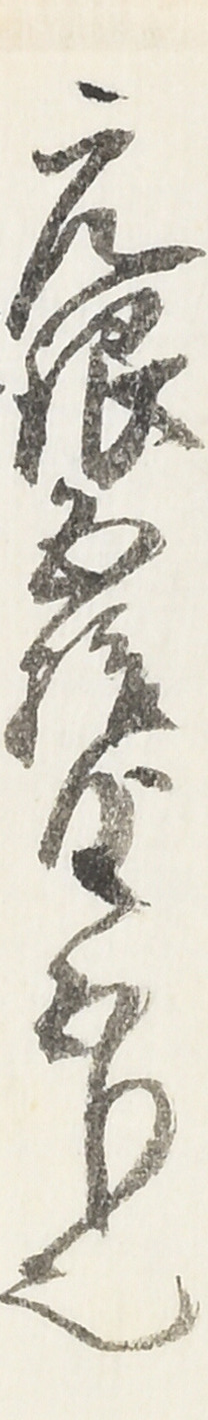元銀五拾匁五分也
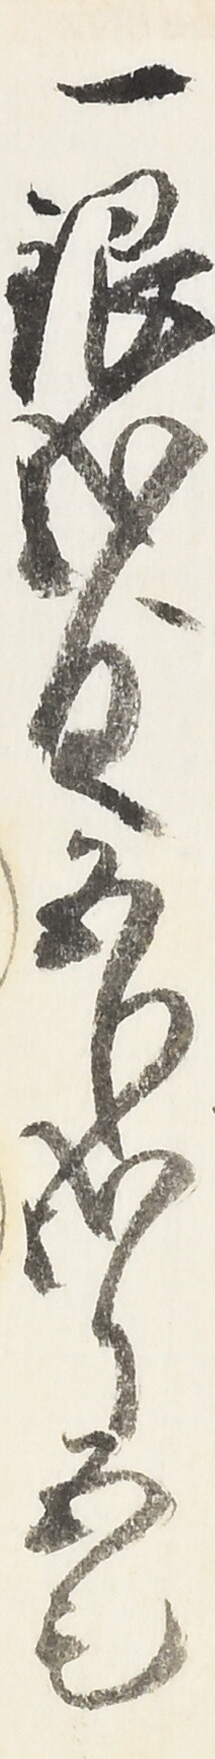一銀弐匁五分弐厘五毛
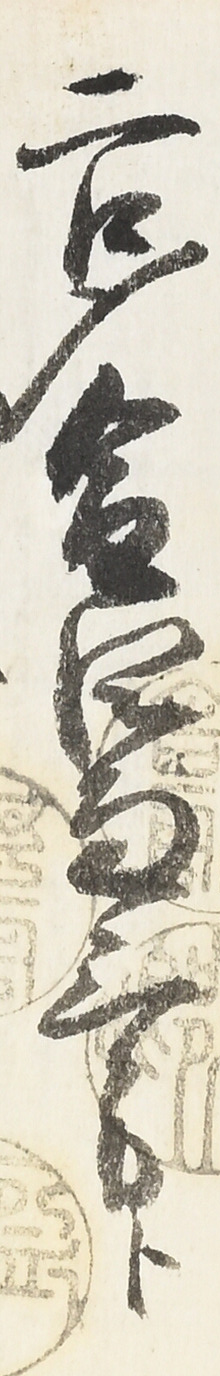二口〆金四両三分ト
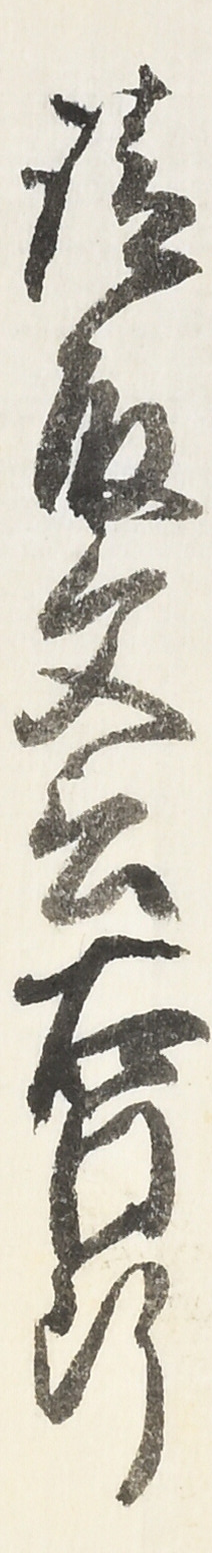請取文言右同断
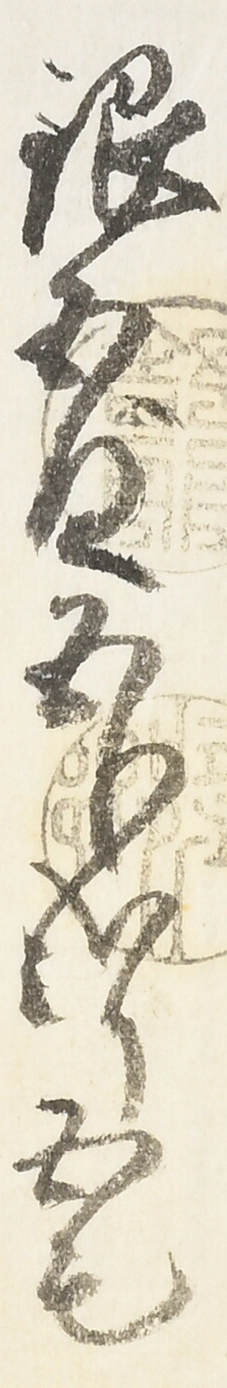銀五匁五分弐厘五毛
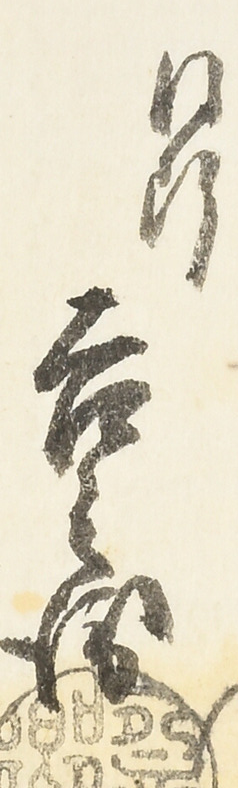吉兵衛
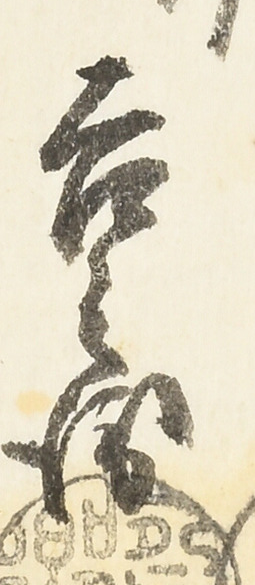吉兵衛
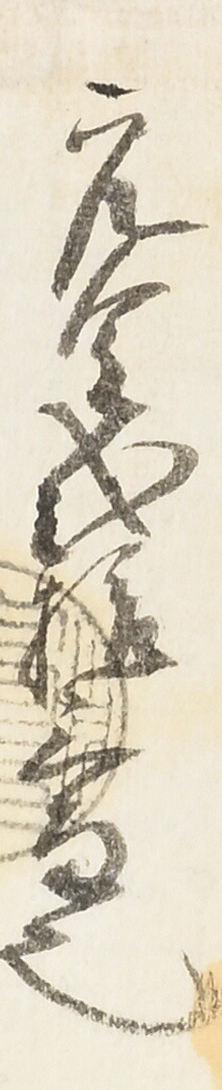元金弐拾三両也
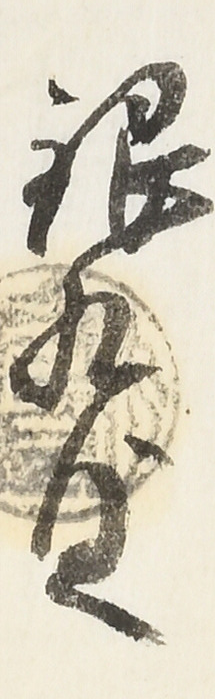銀九匁
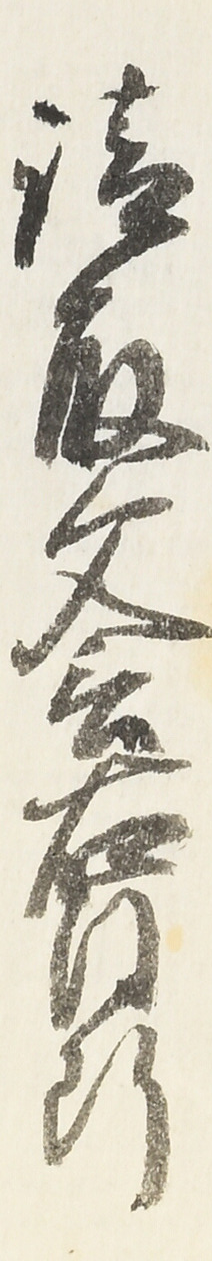請取文言右同断
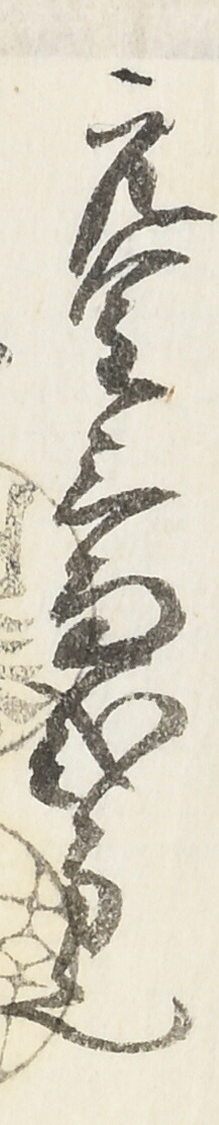元金三両弐分也
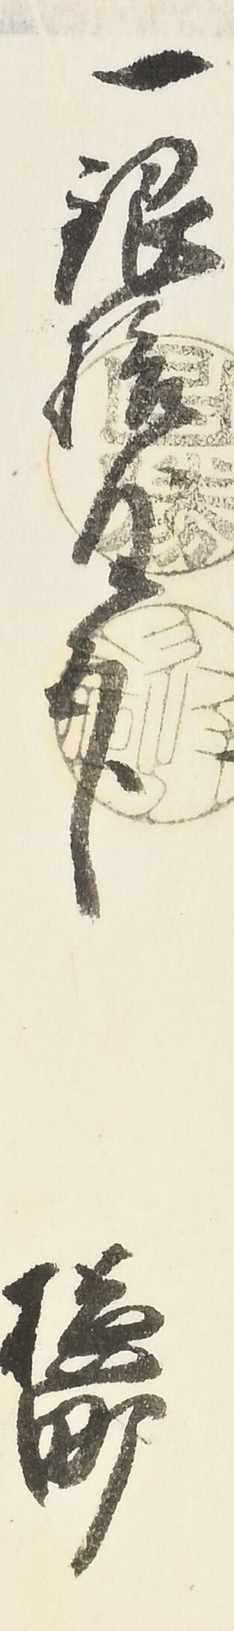一銀拾匁五分横町
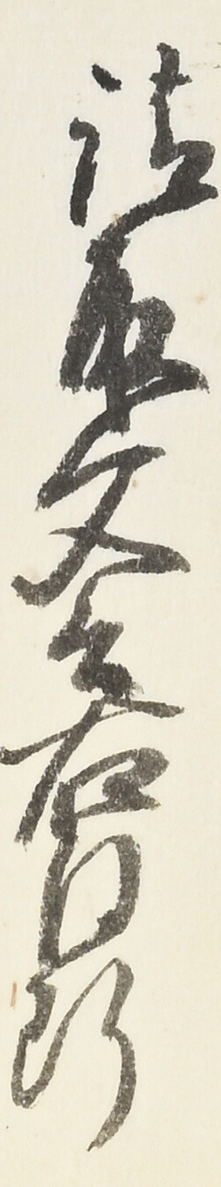請取文言右同断
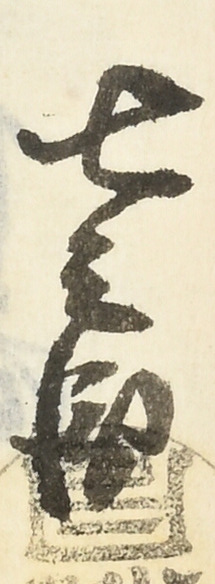吉兵衛

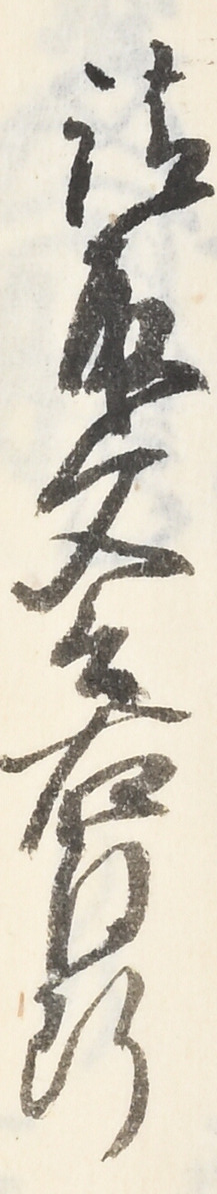請取文言右同断
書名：御才覚金御利足割渡扣帳
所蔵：伊那市立高遠町図書館・合同会社AMANE
